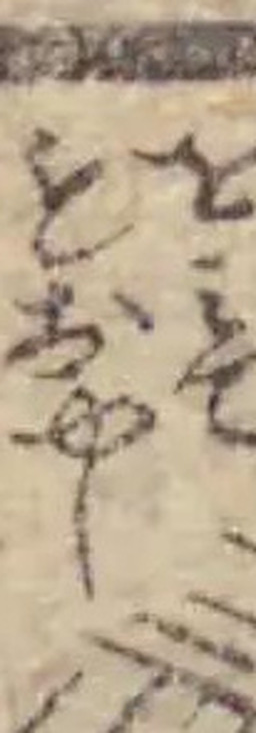もおやし
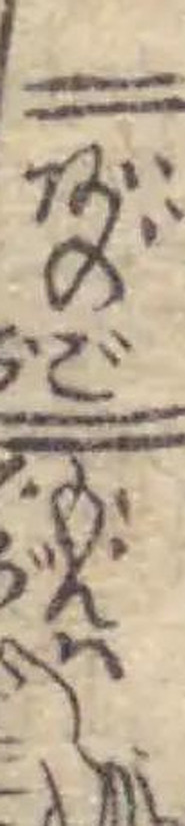あのごもんハ
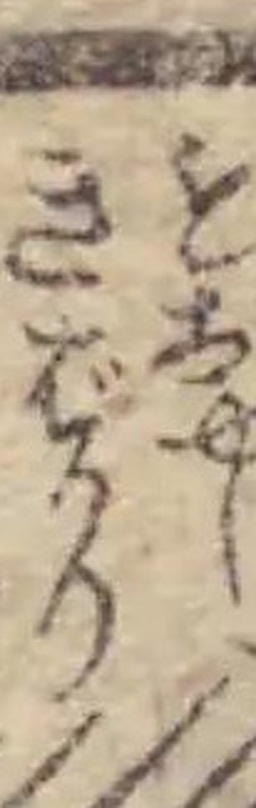きばかり
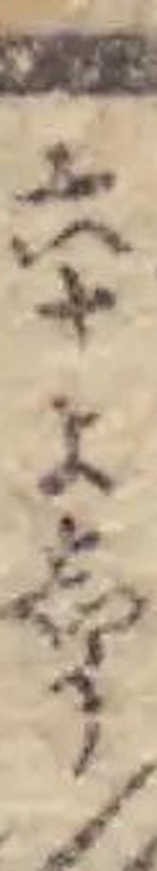六十よしう
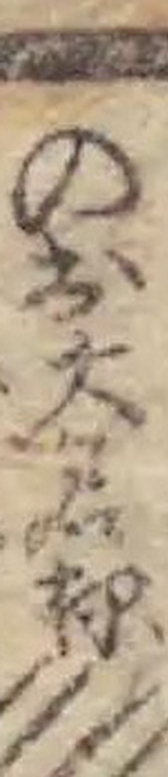のお大名様
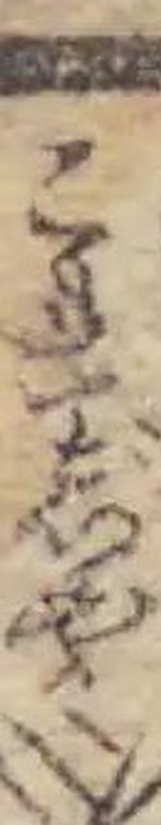これじや
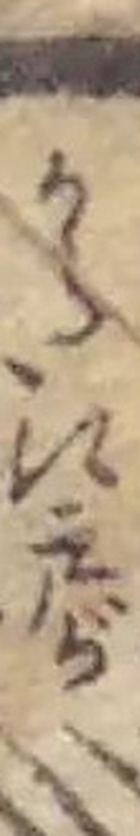から江戸が
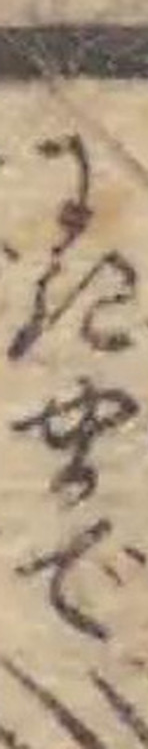にきやかで
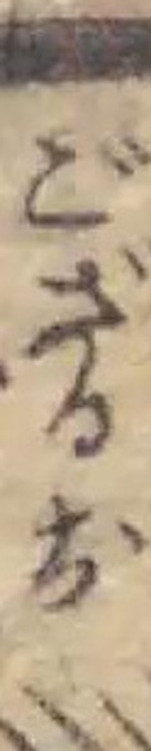ござるお
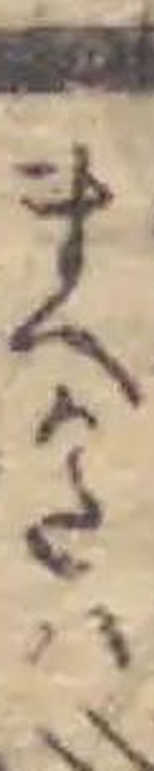まへかたハ
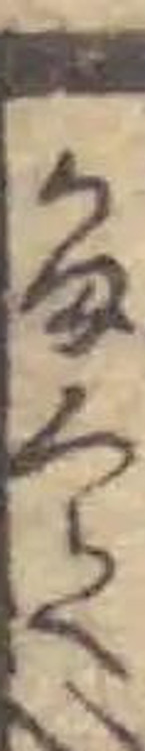かまくらへ
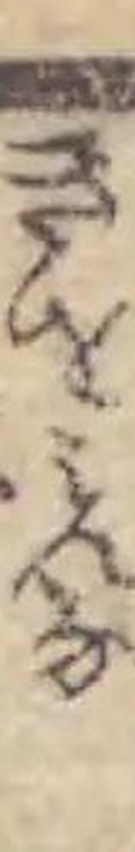きをミんな
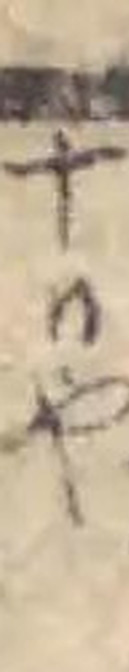十日や
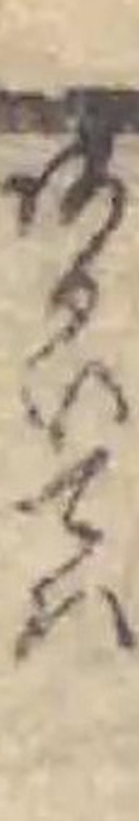あるいてハ
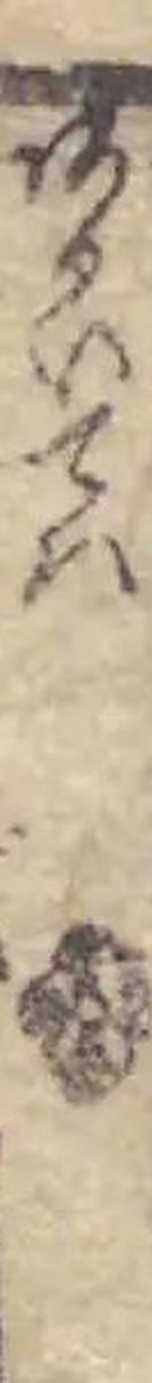あるいてハ
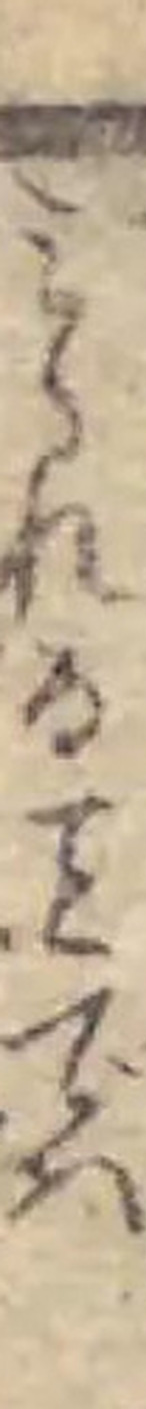ミられることでハ
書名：豆男江戸見物 2巻
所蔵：国立国会図書館 National Diet Library, JAPAN
